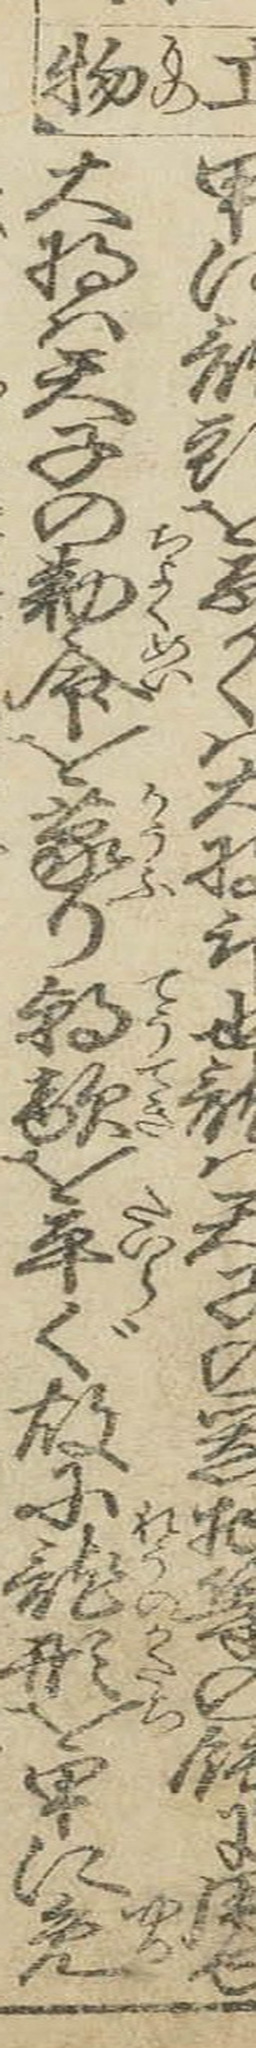大将は天子の勅命を蒙り朝敵を平ぐ故に龍形を甲に免
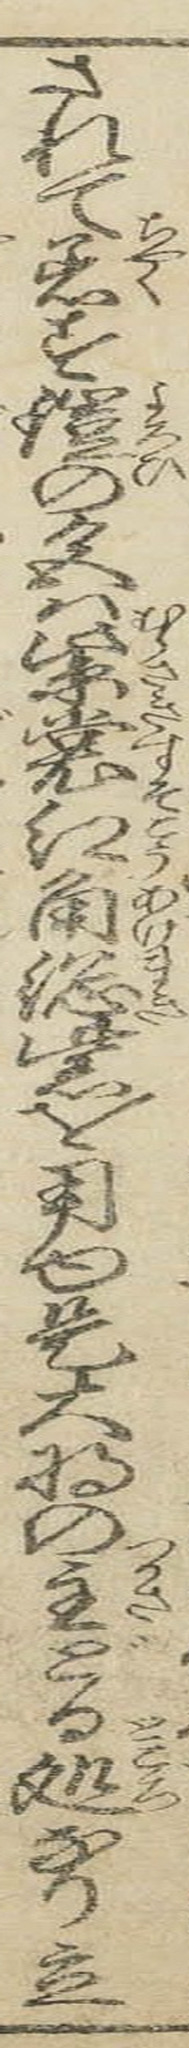されて着す鎧の色は紫裳紅角総紫を用ゆ是大将の主どる処なり立
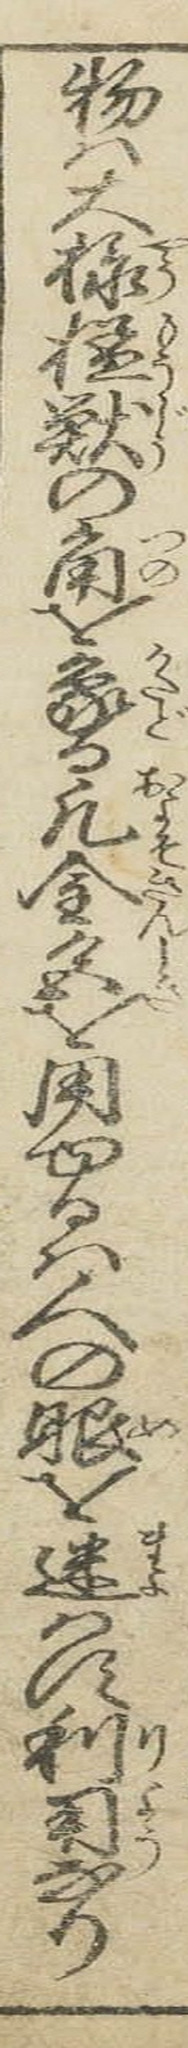物は大様猛獣の角を象る凡金色を用ゆるは人の眼を迷はす利用なり
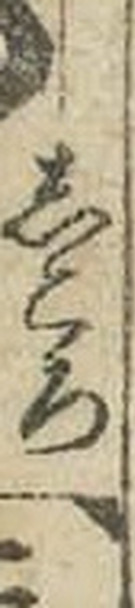しころ
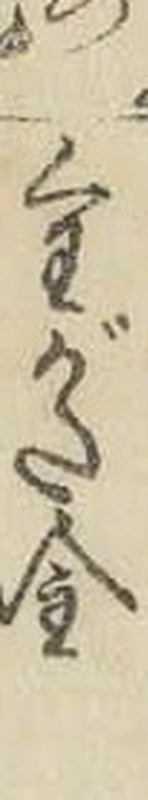くわがた金
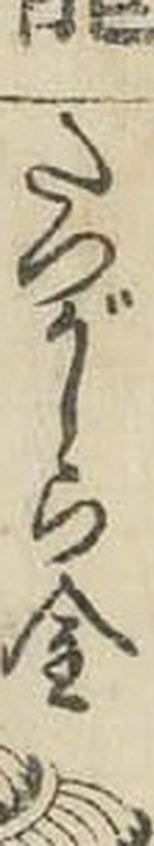たつがしら金
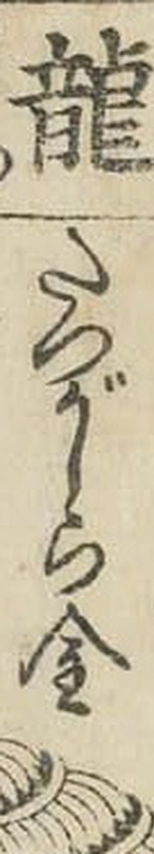たつがしら金
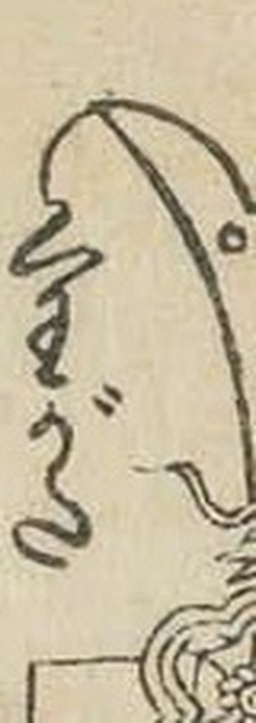くわがた
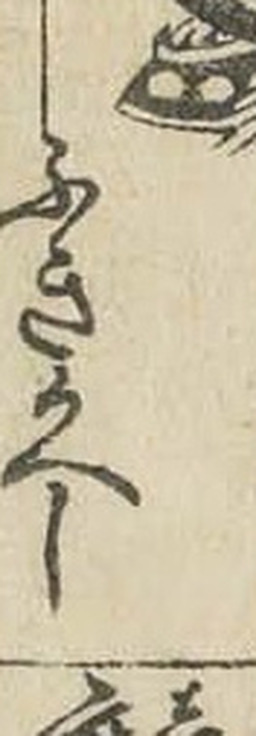ふきかへし
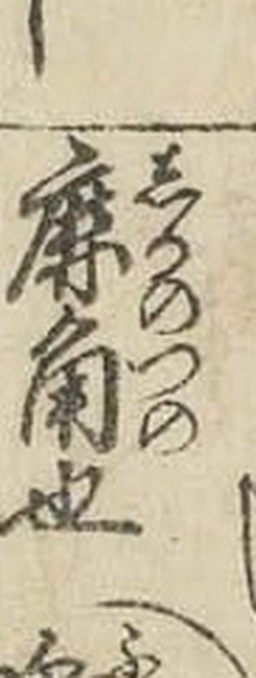鹿角也
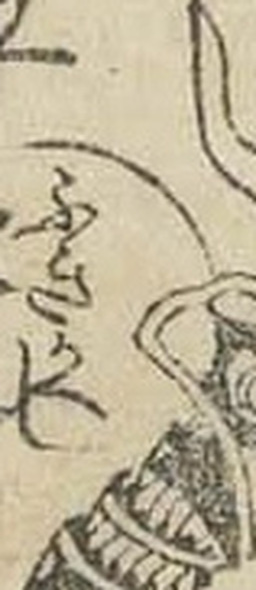ふきかへし
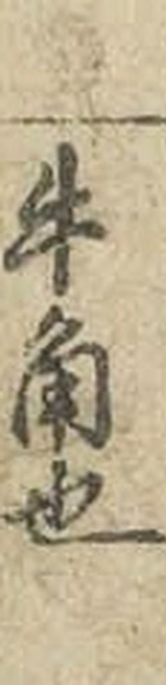牛角也
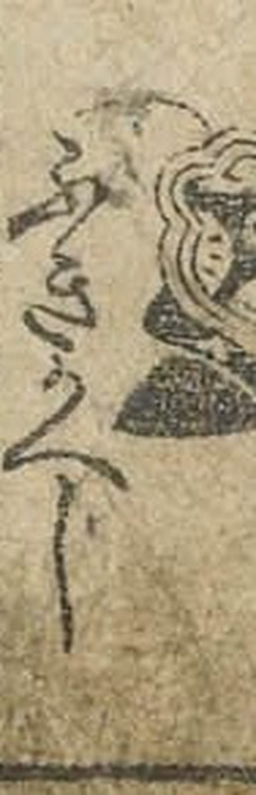ふきかへし
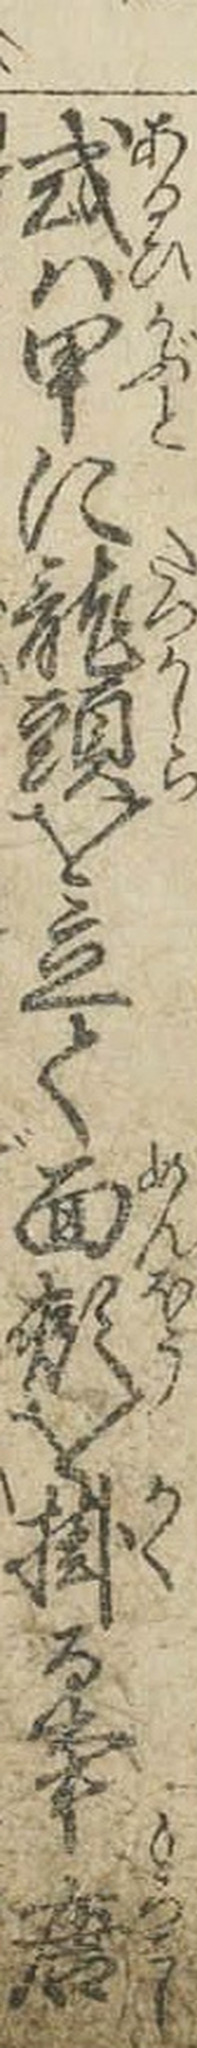或は甲に龍頭を立て面彭を掛る事唐
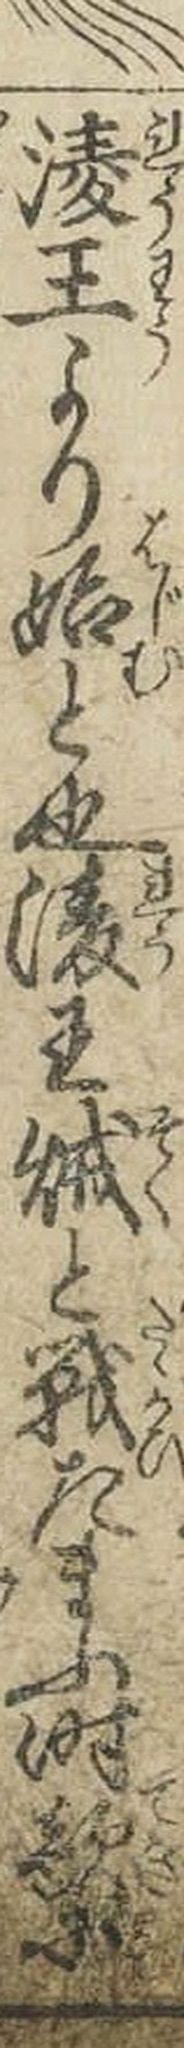淩王より始と也淩王賊と戦たまふ時敵に
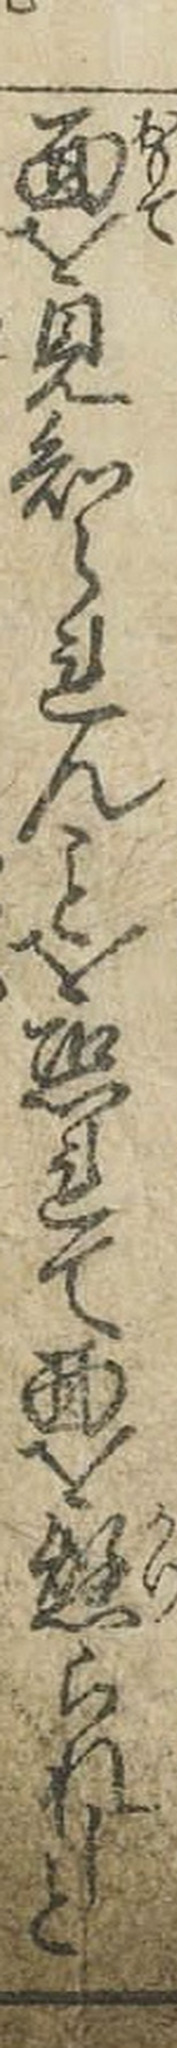面を見知られんことを恐れて面を懸られしと
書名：絵本写宝袋 9巻 2之巻
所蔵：東京学芸大学教育コンテンツアーカイブ
